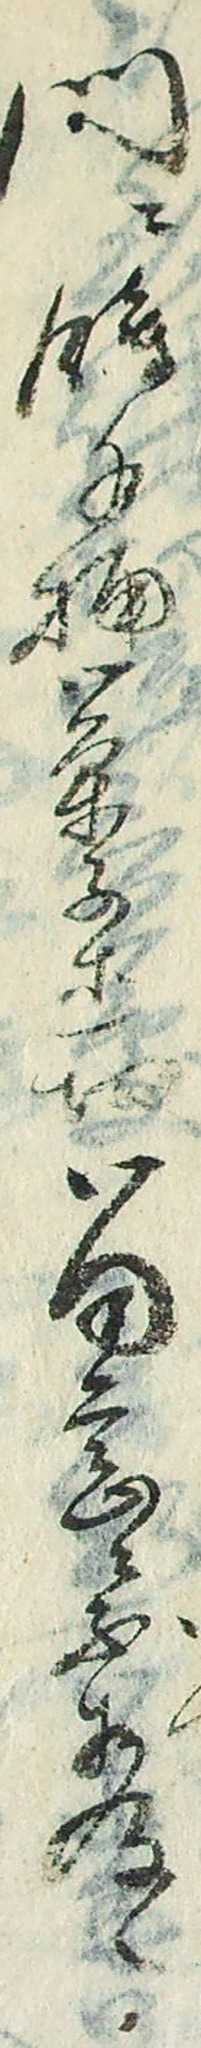門に餝手桶御菓子等一切御用意に不相及候

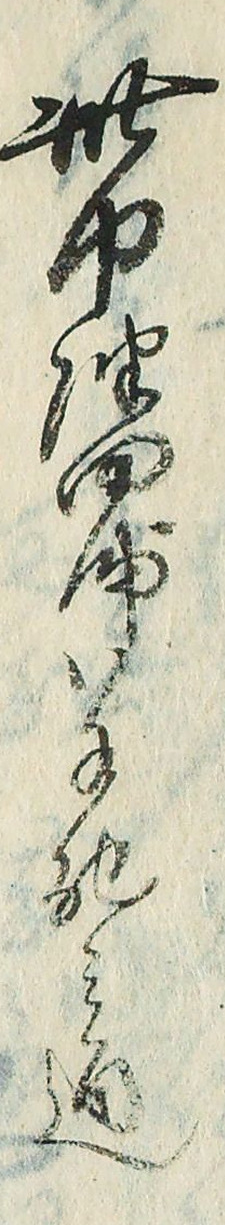此中津田浦御手配之通
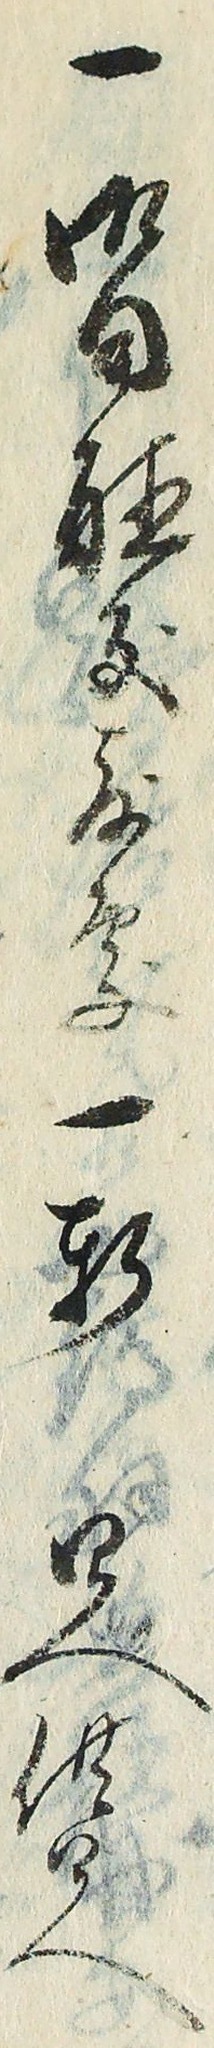一御用聴支度処一軒四人供四人
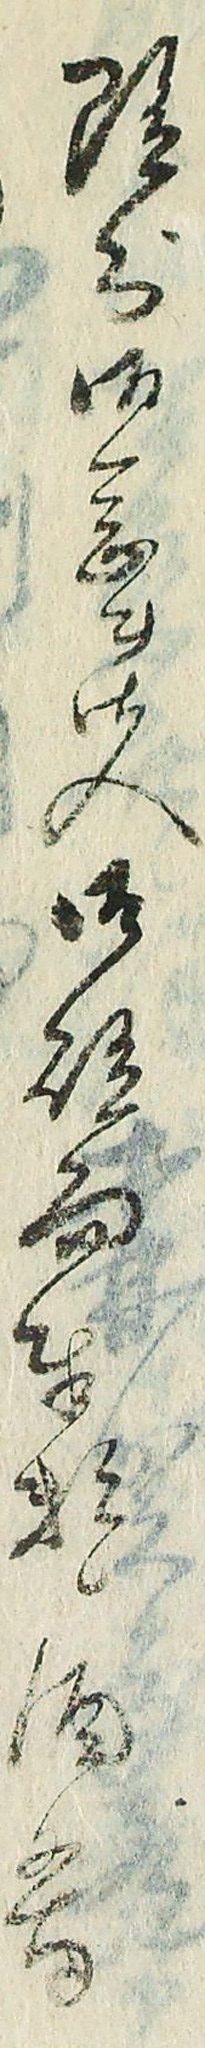随分御意を御入御賄向奉頼候酒肴
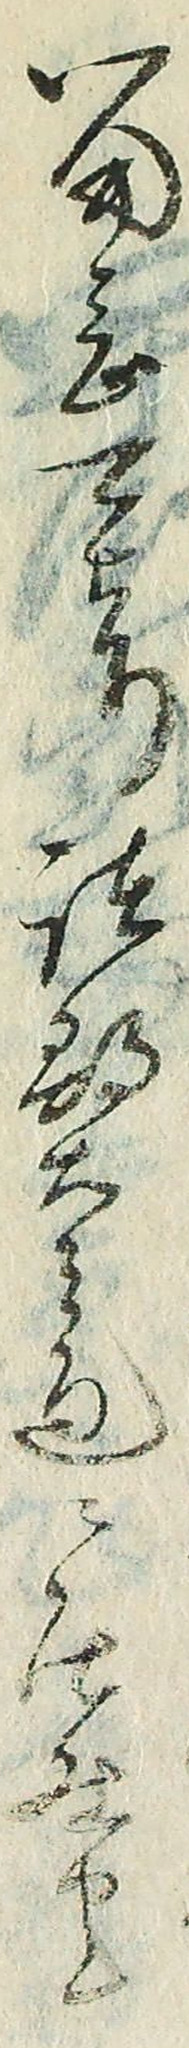御用意可被下候諸郡右之通に仕居申候
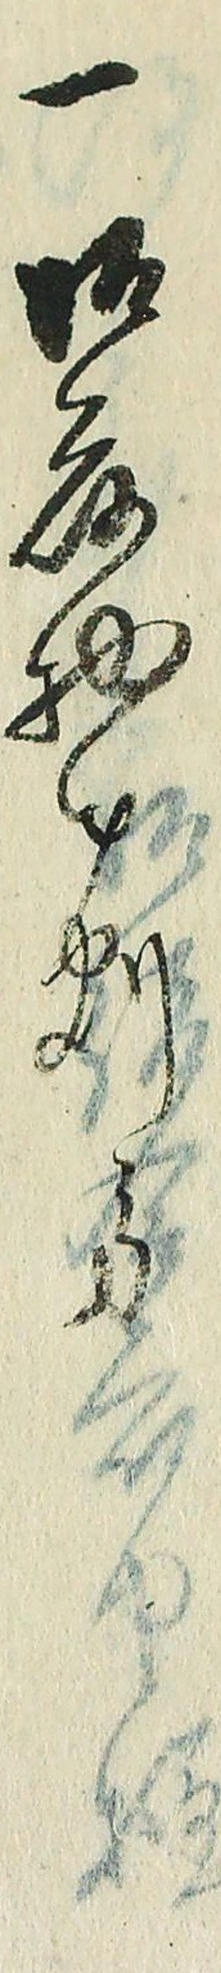一御荷物才判方
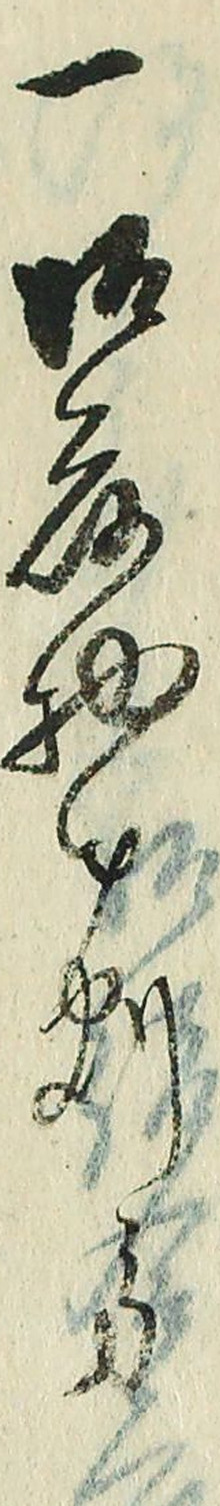一御荷物才判方
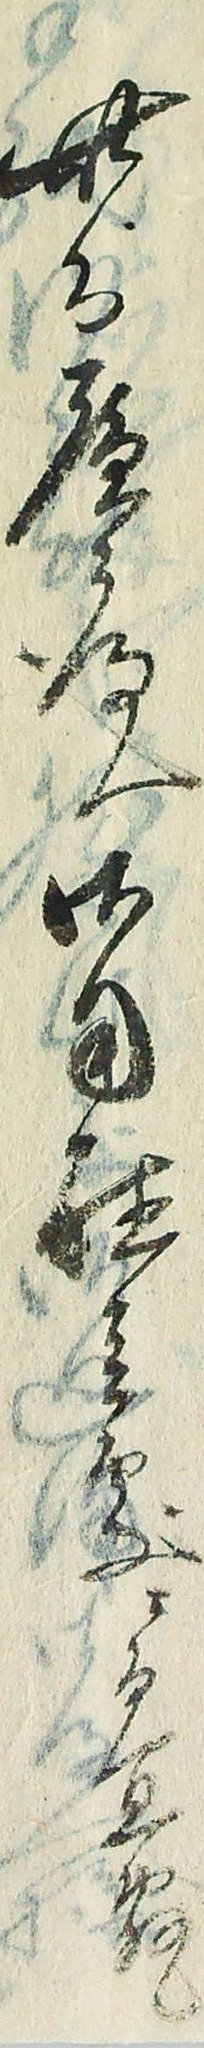此分広候得は御用聴之処にて宜敷候
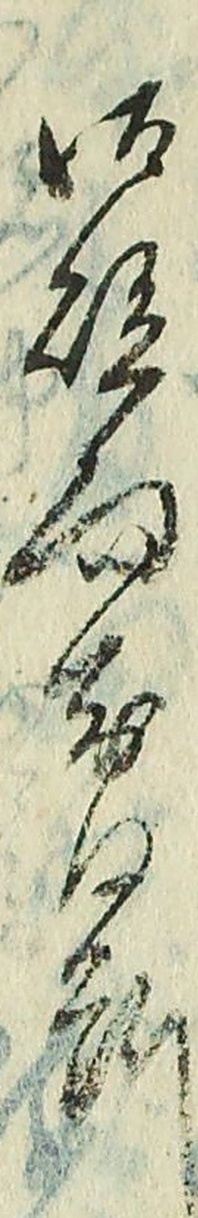御賄向前同断
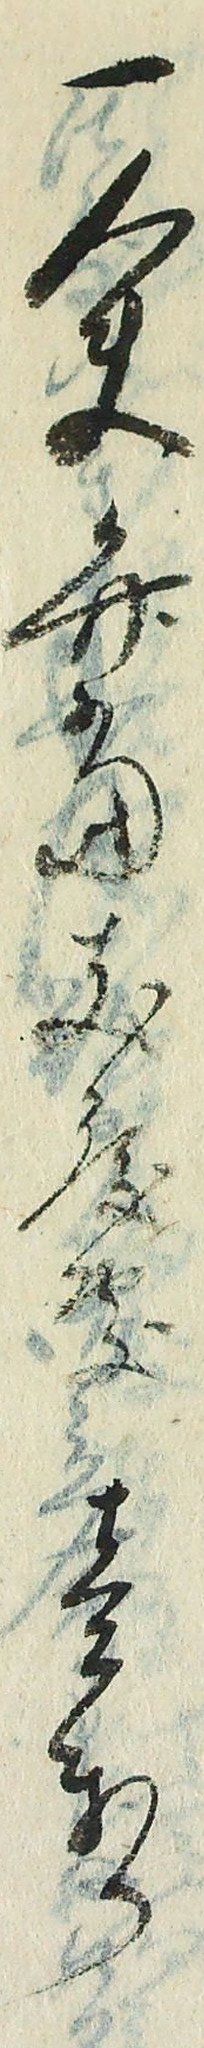一人夫弁当支度処壱軒
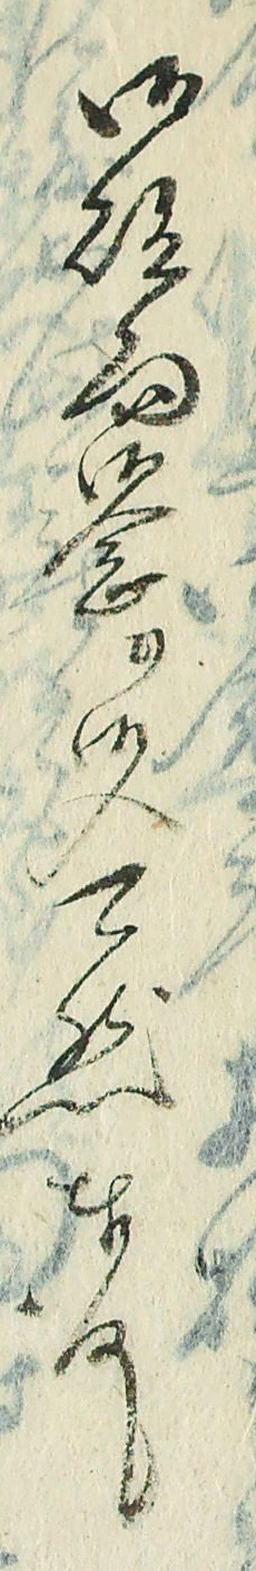御賄向御念を御入可然奉存候
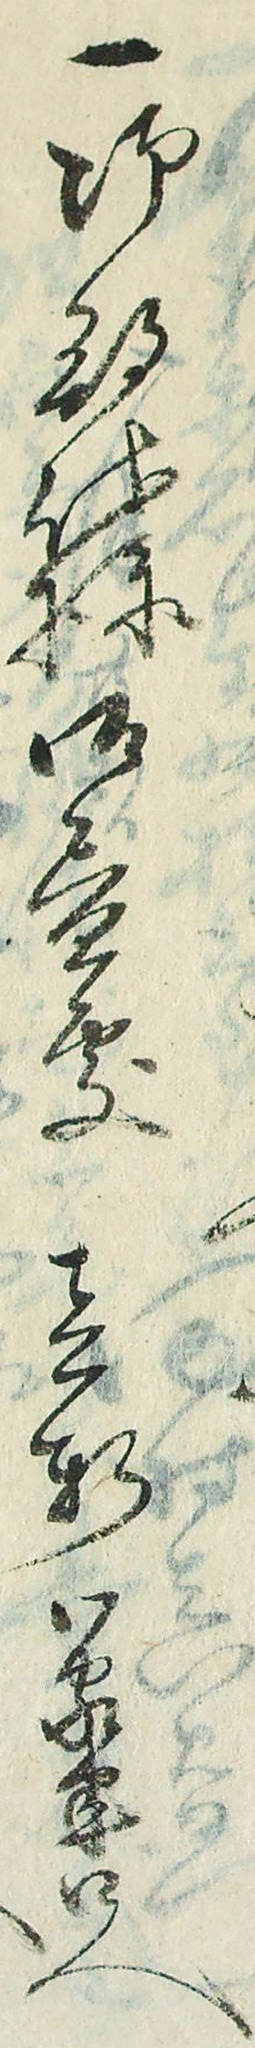一御郡代様御昼処壱軒御家来四人

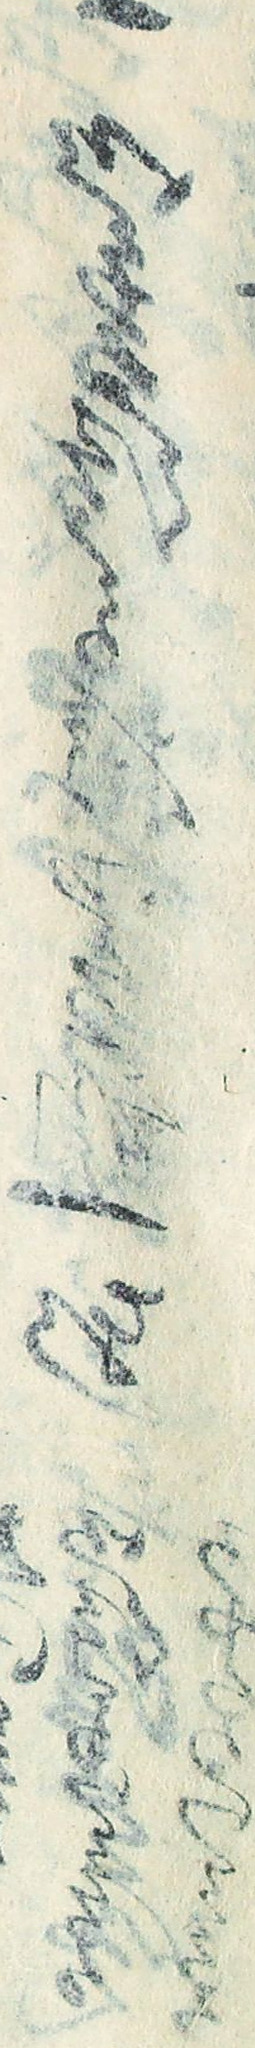八月廿五日
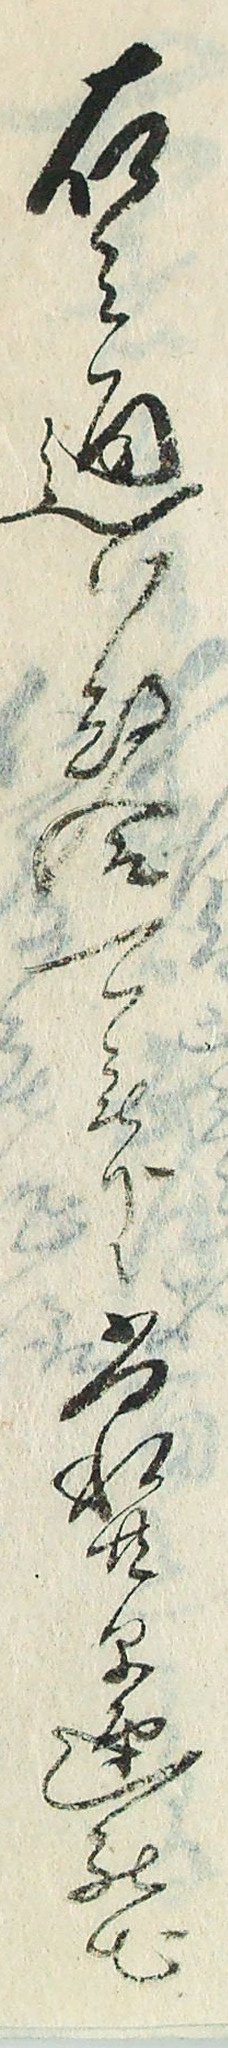右之通御都合可被下候尚私共早速罷出
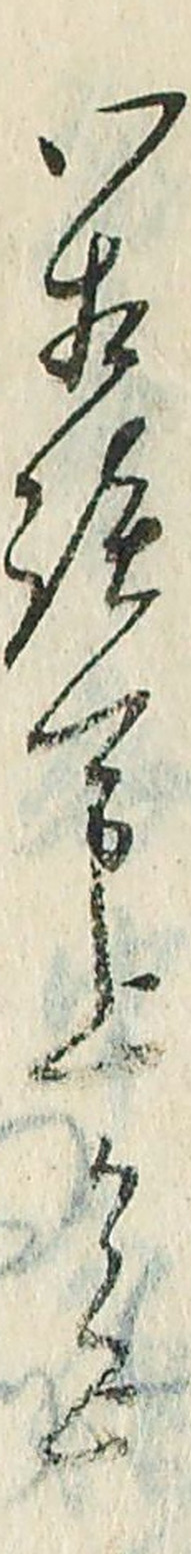御相談可申上候以上
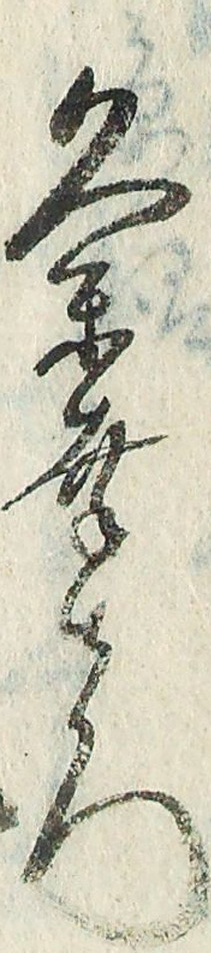久米幸右衛門
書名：公辺御役人為御廻浦御立越諸御用一巻
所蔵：鳴門教育大学 Naruto University of Education
